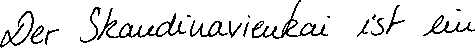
Der Skandinavienkai ist ein
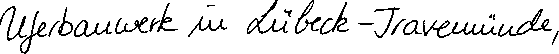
Uferbauwerk in Lübeck-Travemünde,
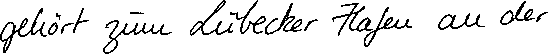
gehört zum Lübecker Hafen an der
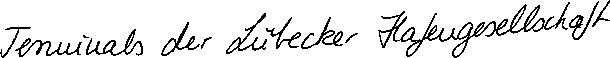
Terminals der Lübecker Hafengesellschaft
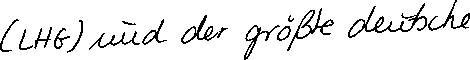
(LHG) und der größte deutsche
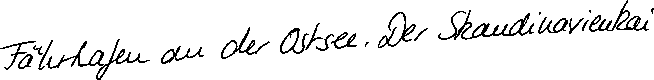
Fährhafen an der Ostsee. Der Skandinavienkai
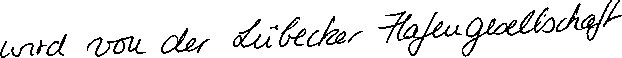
wird von der Lübecker Hafengesellschaft
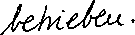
betrieben.
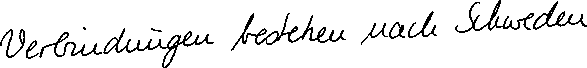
Verbindungen bestehen nach Schweden
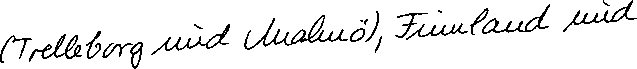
(Trelleborg und Malmö), Finnland und
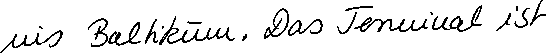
ins Baltikum. Das Terminal ist
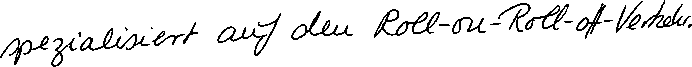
pezialisiert auf den Roll-on-Roll-off-Verkehr.
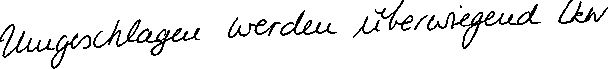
Umgeschlagen werden überwiegend Lkw
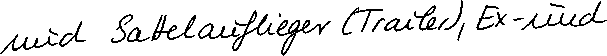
und Sattelauflieger (Trailer), Ex- und
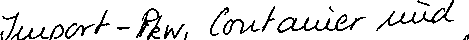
Import-Pkw, Container und
